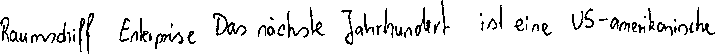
Raumschiff Enterprise Das nächste Jahrhundert ist eine US-amerikanische
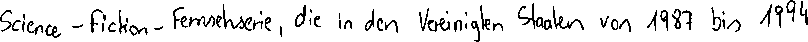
Science-Fiction-Fernsehserie, die in den Vereinigten Staaten von 1987 bis 1994
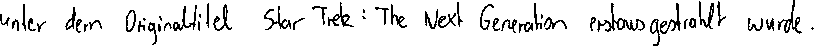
unter dem Originaltitel Star Trek: The Next Generation erstausgestrahlt wurde.
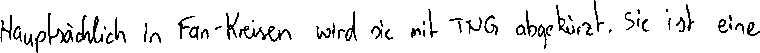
Hauptsächlich in Fan-Kreisen wird sie mit TNG abgekürzt. Sie ist eine
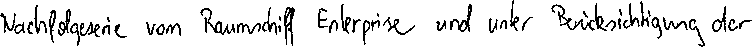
Nachfolgeserie von Raumschiff Enterprise und unter Berücksichtigung der
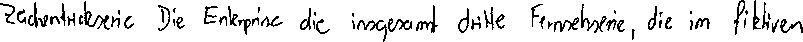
Zeichentrickserie Die Enterprise die insgesamt dritte Fernsehserie, die im fiktiven
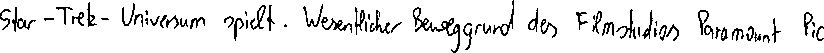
Star-Trek-Universum spielt. Wesentlicher Beweggrund des Filmstudios Paramount Pic
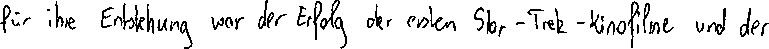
für ihre Entstehung war der Erfolg der ersten Star-Trek-Kinofilme und der
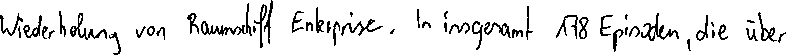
Wiederholungen von Raumschiff Enterprise. In insgesamt 178 Episoden, die über
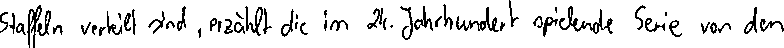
Staffeln verteilt sind, erzählt die im 24. Jahrhundert spielende Serie von den
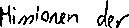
Missionen der
